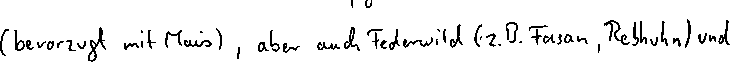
(bevorzugt mit Mais), aber auch Federwild (z. B. Fasan, Rebhuhn) und
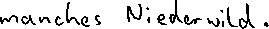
manches Niederwild.
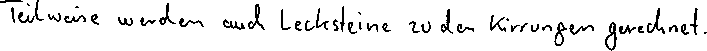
Teilweise werden auch Lecksteine zu den Kirrungen gerechnet.
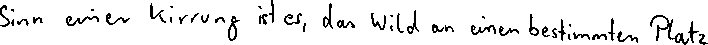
Sinn einer Kirrung ist es, das Wild an einen bestimmten Platz
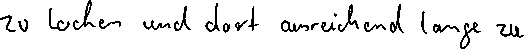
zu locken und dort ausreichend lange zu
